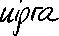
nigra
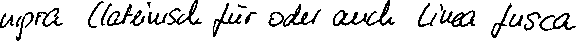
nigra (lateinisch für oder auch Linea fusca
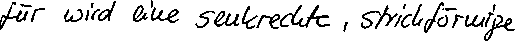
für wird eine senkrechte, strichförmige
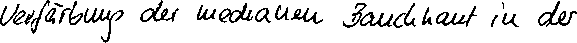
Verfärbung der medianen Bauchhaut in der
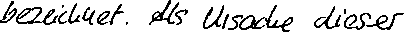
bezeichnet. Als Ursache dieser
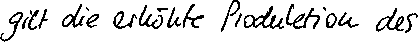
gilt die erhöhte Produktion des
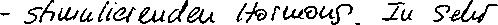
-stimulierenden Hormons. In sehr
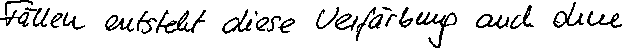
Fällen entsteht diese Verfärbung auch ohne
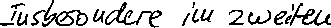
Insbesondere im zweiten
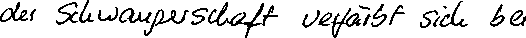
der Schwangerschaft verfärbt sich bei
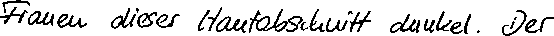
Frauen dieser Hautabschnitt dunkel. Der
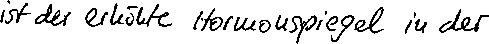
ist der erhöhte Hormonspiegel in der
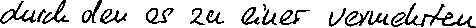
durch den es zu einer vermehrten
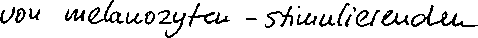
von melanozyten-stimulierenden
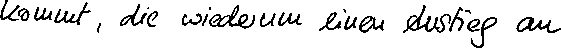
kommt, die wiederum einen Anstieg an
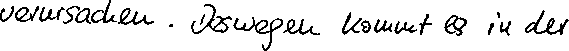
verursachen. Deswegen kommt es in der
